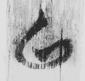㠯（以）
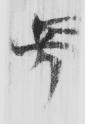長
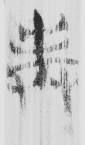奉
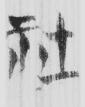社
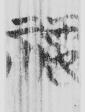禝
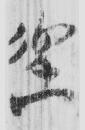𫊟
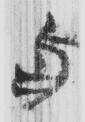此
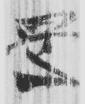是
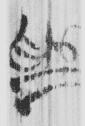爲
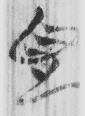見
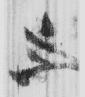之
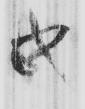女
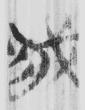我
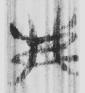弗
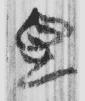見
